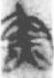魚
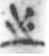之
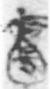○（韔）
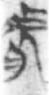○（虎）
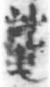○（貘）
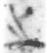之
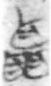聶（攝）
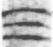三
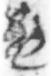○（貂）
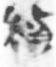紫
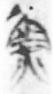魚
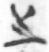之
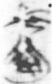○（箙）
